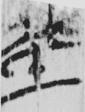○（吾）
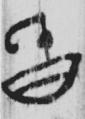昏（聞）
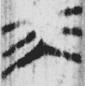夫
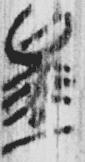○（舜）
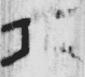亓（其）
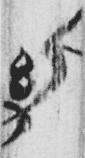幼
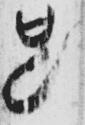也
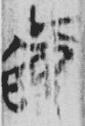每（敏）
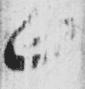㠯（以）
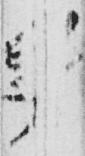學
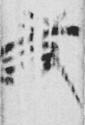寺（詩）
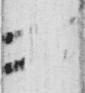亓（其）
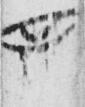言
